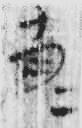十月
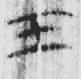壬
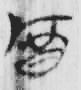晨
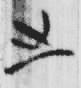之
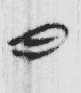日
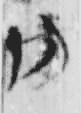仿
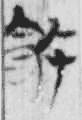○（令）
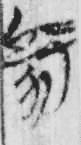○（賢）
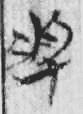受
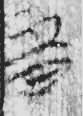○（期）
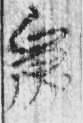○（爨）
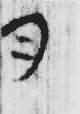月
